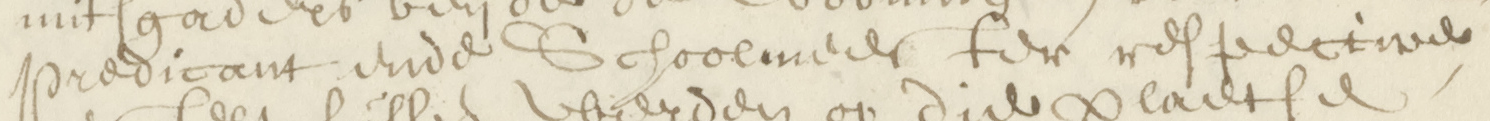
Predicant ende Schoolmeester respective
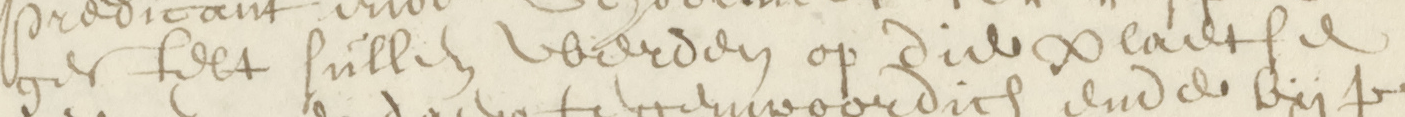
gestelt sullen werden op die Plaetse
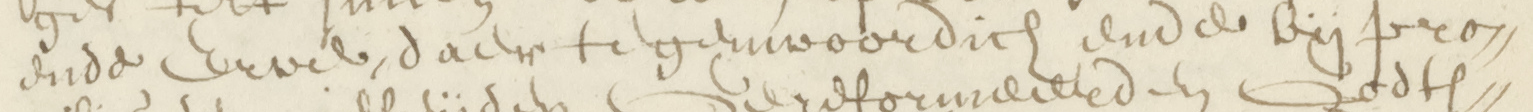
ende Erve, daer tegenwoordich ende bij pro,,
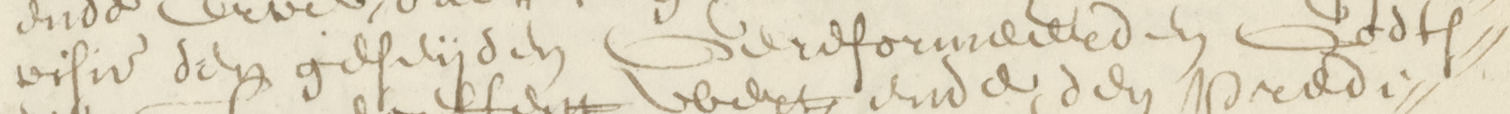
visie den geseijden Gereformeerden Godts,,
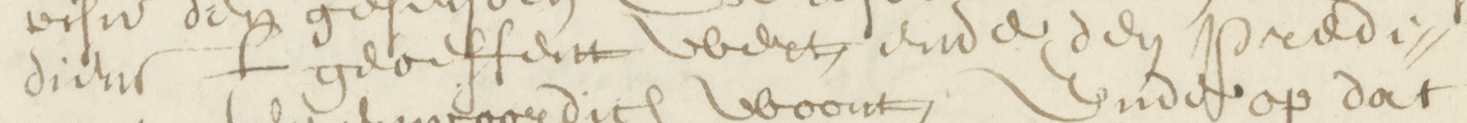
dienst geoeffent wert, ende den Predi,,
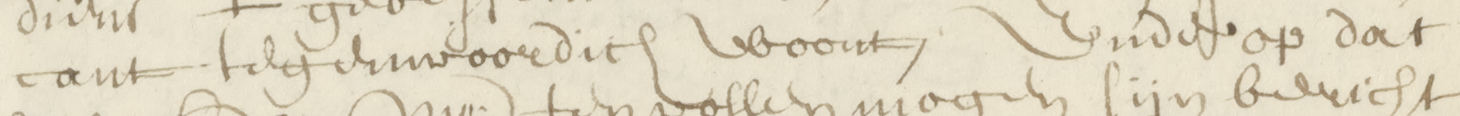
cant tegenwoordich woont. Ende op dat
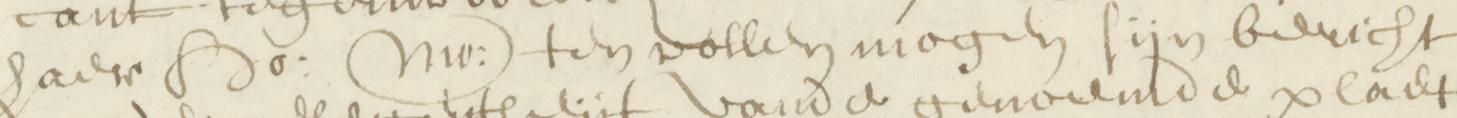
haer Ho:Mo: ten vollen mogen sijn bericht
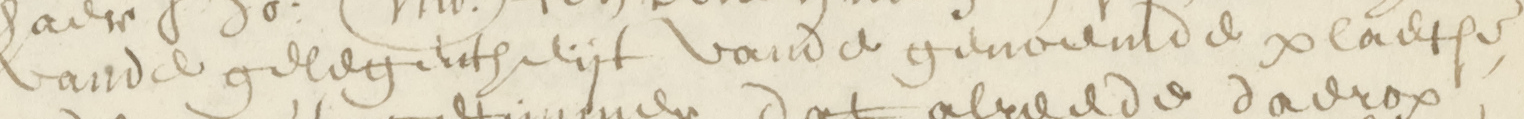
vande gelegentheijt vande genoemde plaetse,
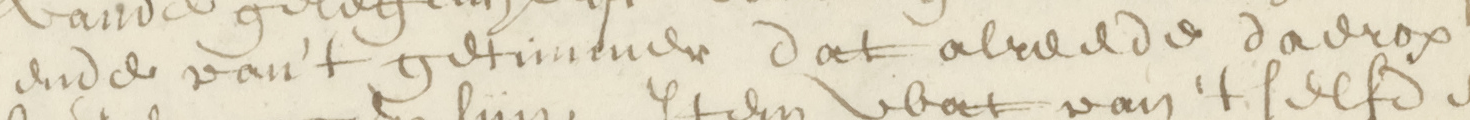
ende van't getimmer dat alreede daerop
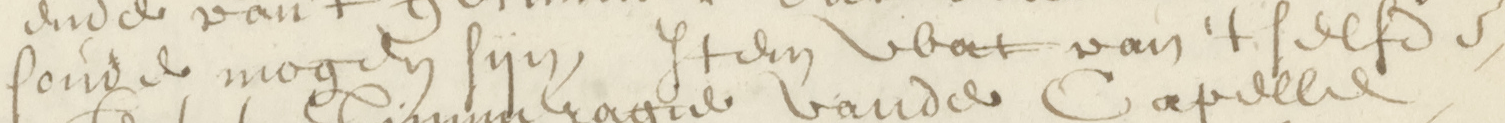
soude mogen sijn. Item wat van 't selfde
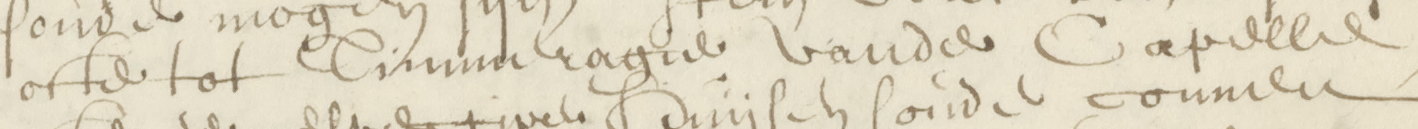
ofte tot Timmeragie vande Capelle,
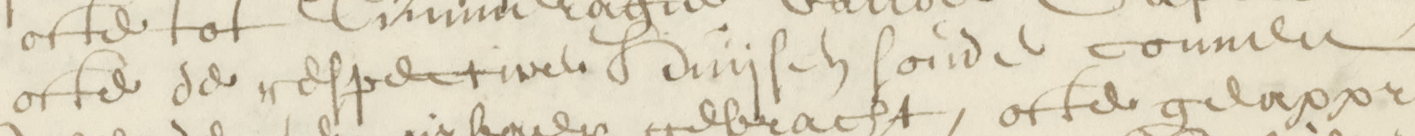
ofte de respective Huijsen soude connen
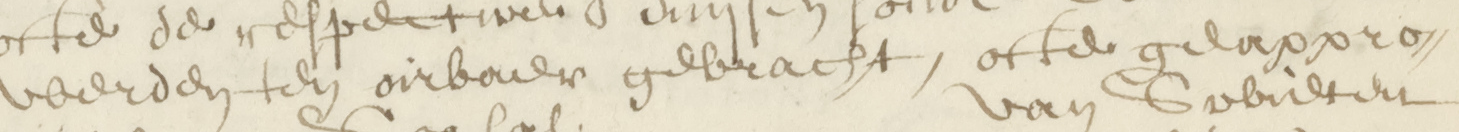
werden ten oirbaer gebracht, ofte geappro,,
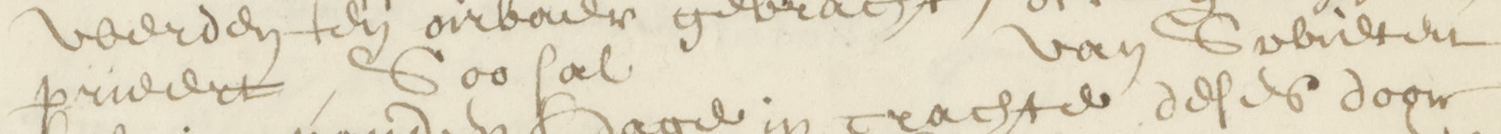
prieert, Soo sal van Swieten
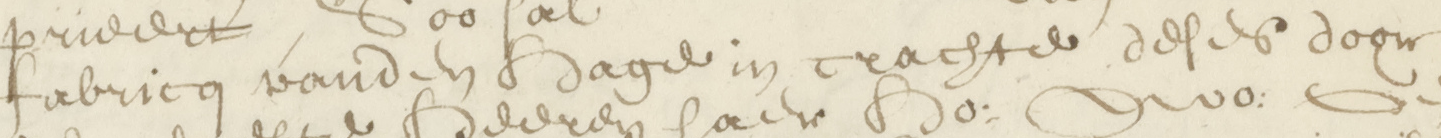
fabricq vanden Hage in crachte deses door
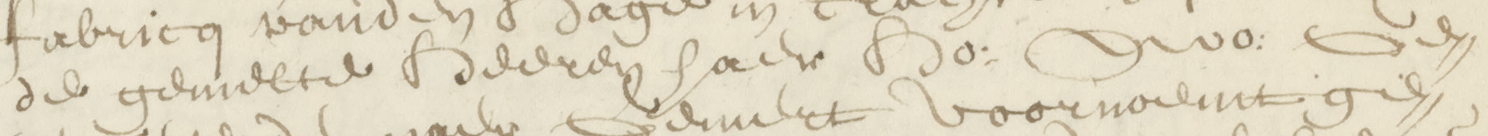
de gemelte Heeren haer Ho:Mo: Ge,,
